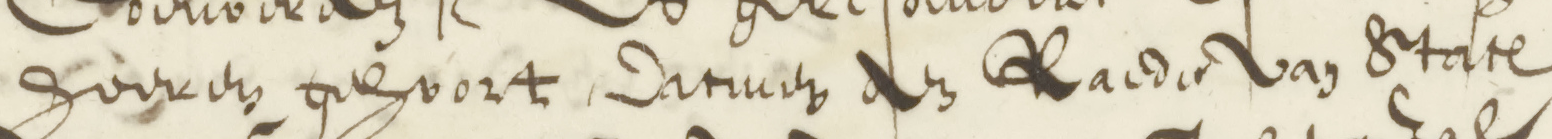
heeren gehoort, datmen den Raede van State
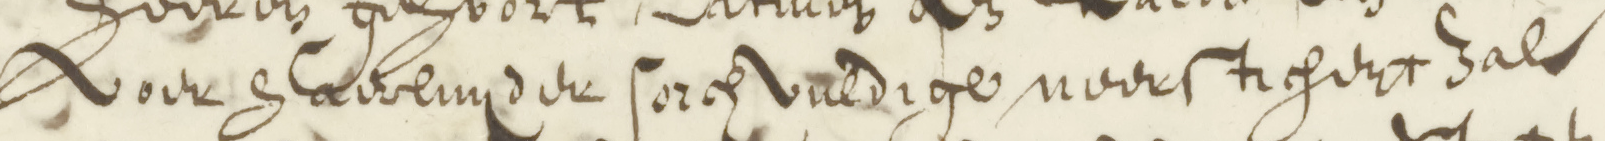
voer haerluyder sorchvuldige neersticheyt zal
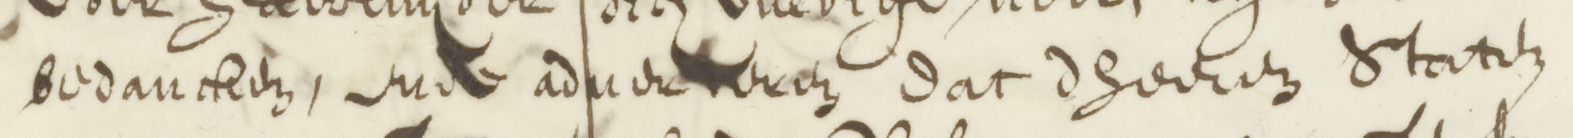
bedancken, ende aduerteren dat dheeren Staten
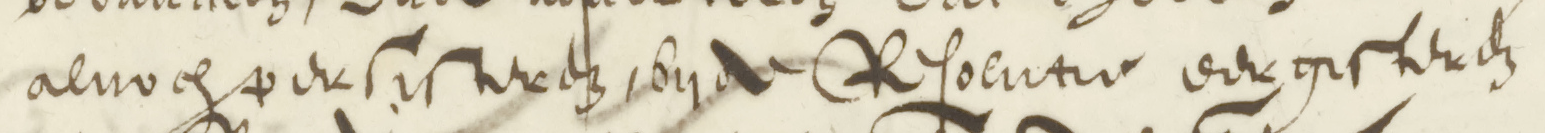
alnoch persisteren, byde Resolutie eergisteren
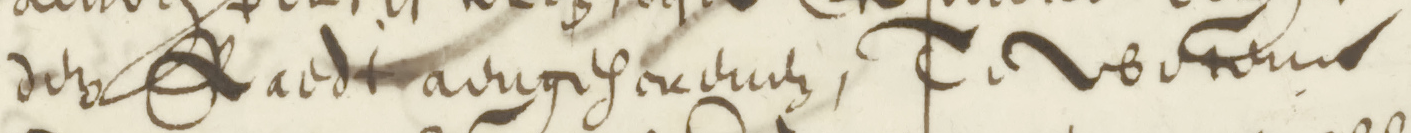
den Raedt aengescreuen, te wetens
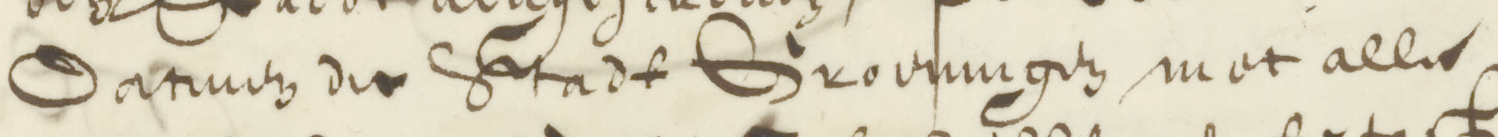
Datmen de Stadt Groeningen met alle
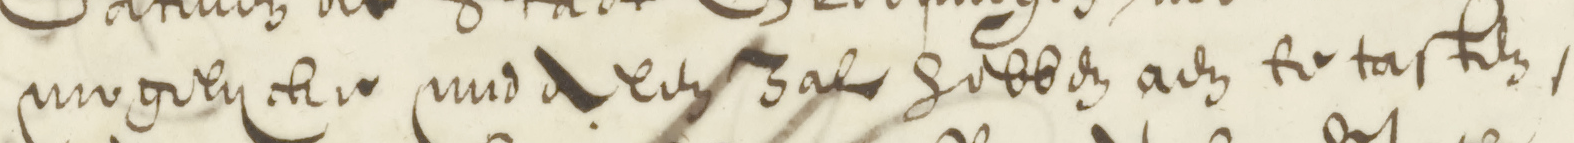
mogelycke middelen zal hebben aen te tasten,
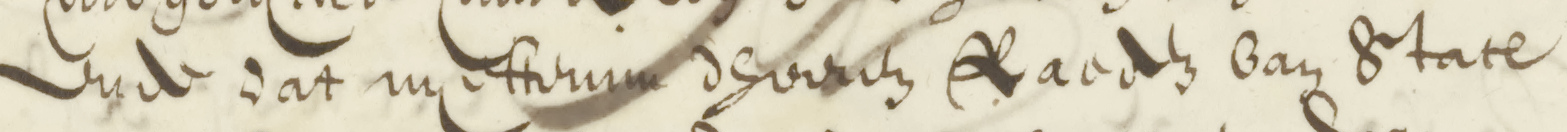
Ende dat mettenim dheren Raeden van State
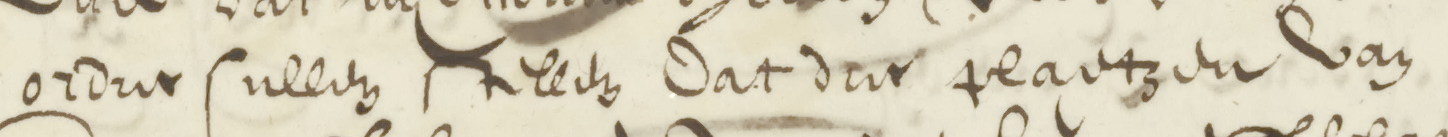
orde sullen stellen dat die plaetzen van
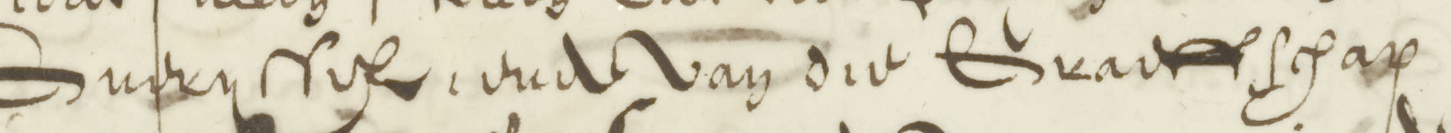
Oueryssel, ende van die Graeffschap
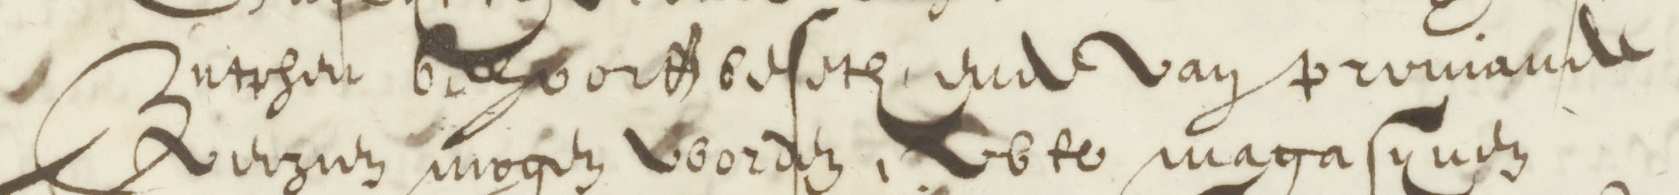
Zutphen behoorl beseth, ende van proviande
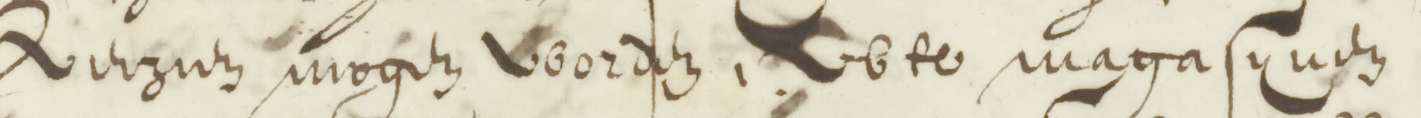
verzien mogen worden, Wte magasynen
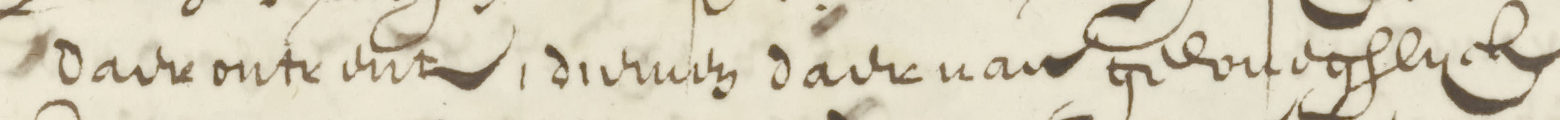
daerontrent, diemen daernae gevueghlyck
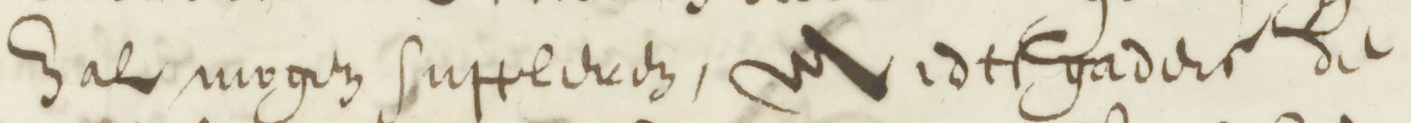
zal mogen suppleren, Midtsgaders de
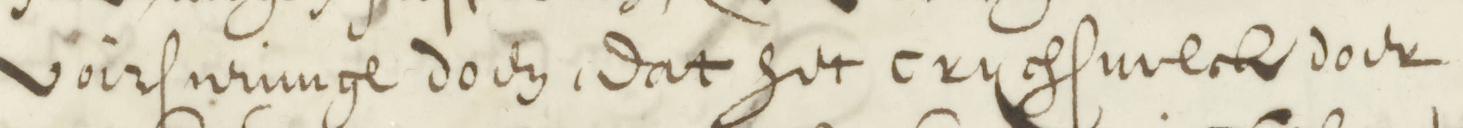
voirsieninge doen, dat het crychsuolck doer
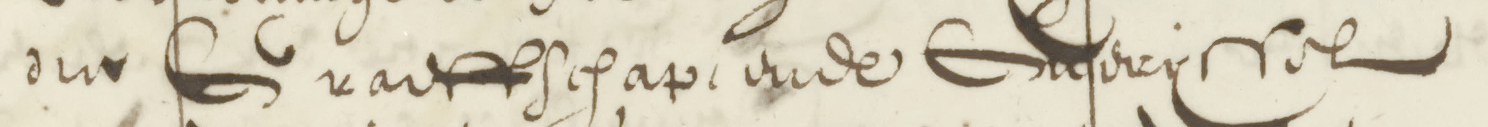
die Graeffschap, ende Overijssel
